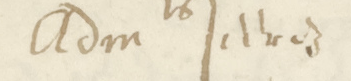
Admtsheeren
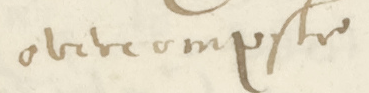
overcompste
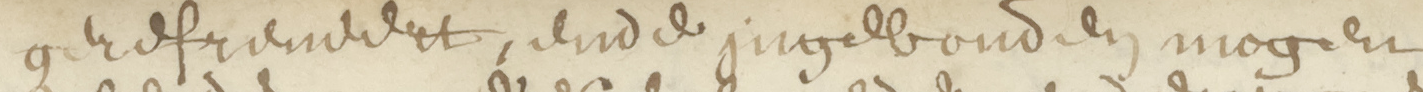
gerefreneert, ende ingebonden mogen
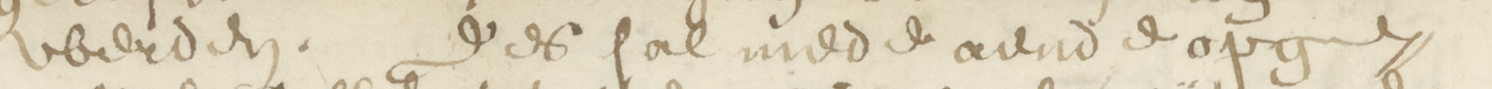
werden. Des sal mede aende opge„
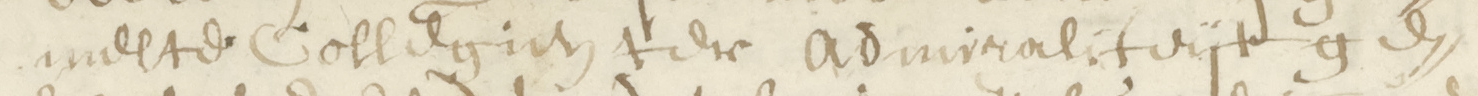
melte Collegien ter Admiraliteijt ge„
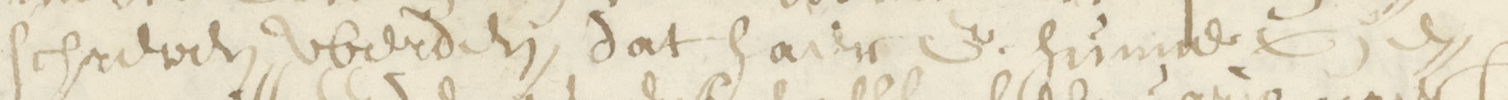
schreven werden, dat haer E. hunne ge„
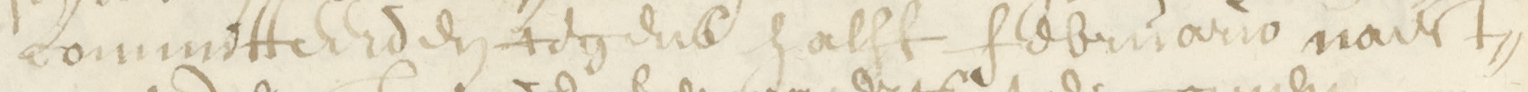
committeerden tegens halff februario naest„
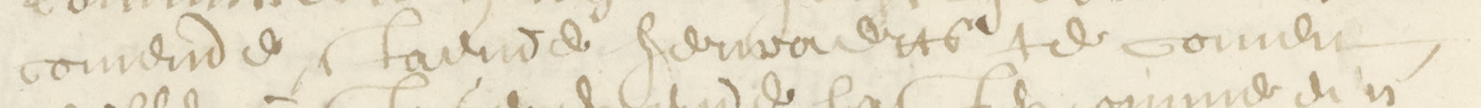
comende staende herwaerts te comen,
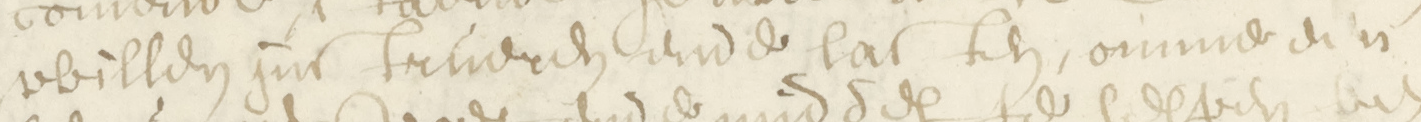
willen instrueren ende lasten, omme een
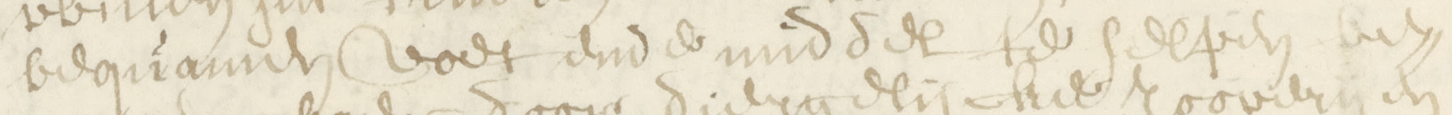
bequamen voet ende middel te helpen be„
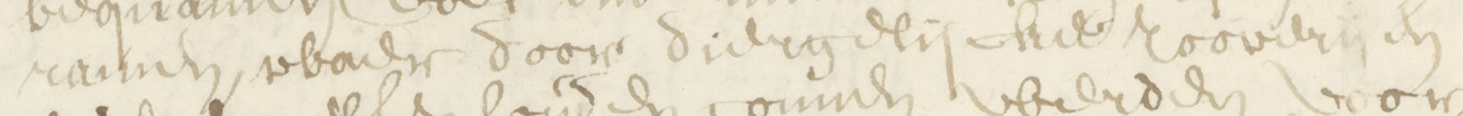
ramen, waer door diergelijcke rooverijen
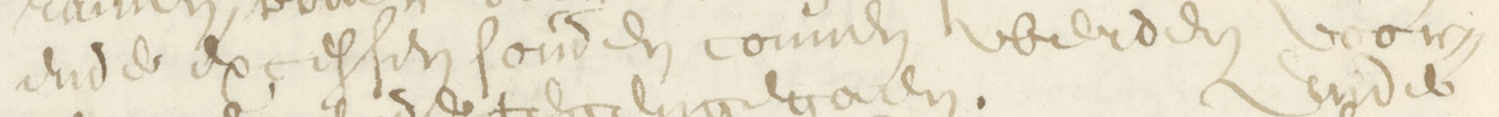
ende excessen souden connen werden voor„
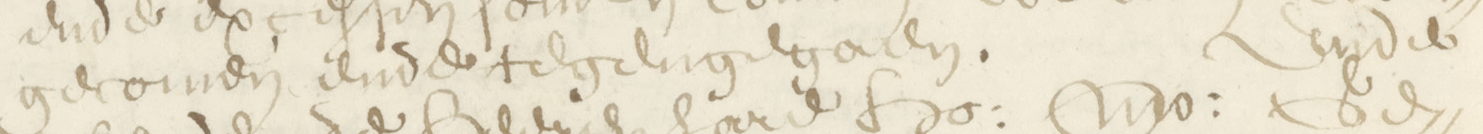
gecomen ende tegengegaen. Ende
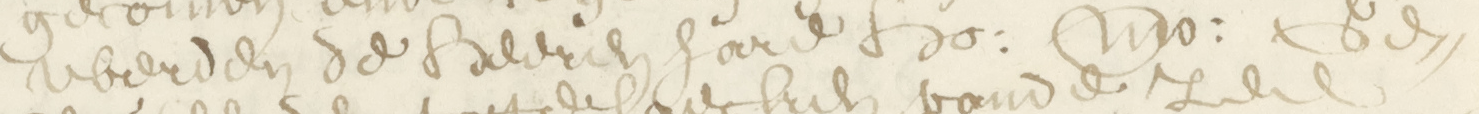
werden de Heeren hare Ho:Mo: Ge„
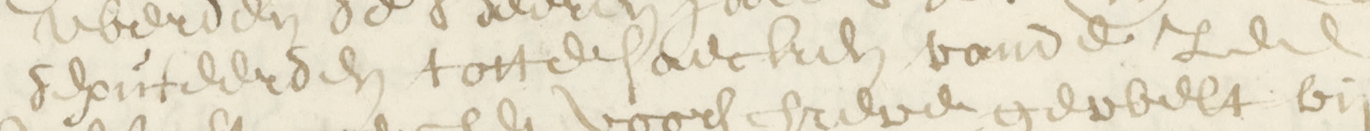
deputeerden totte saecken vande Zee
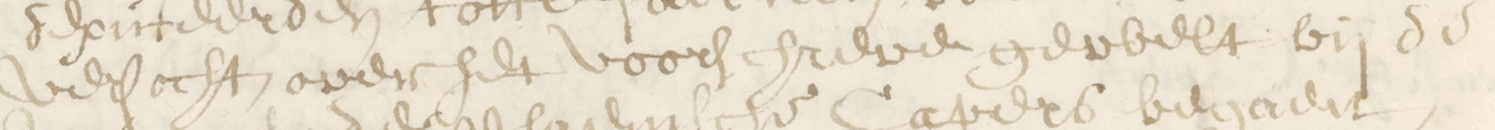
versocht, over het voorschreve gewelt bij de
